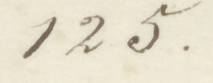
125.
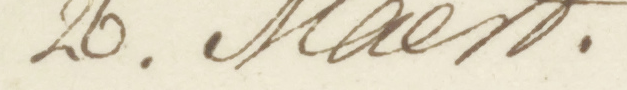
26. Maert.
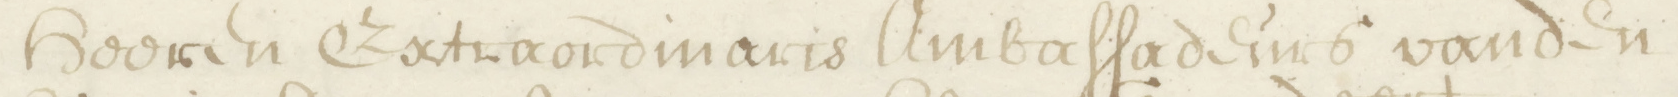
heeren Extraordinaris Ambassadeurs vanden
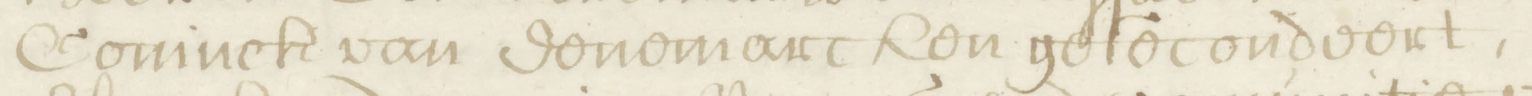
Coninck van Denemarcken gesecondeert,
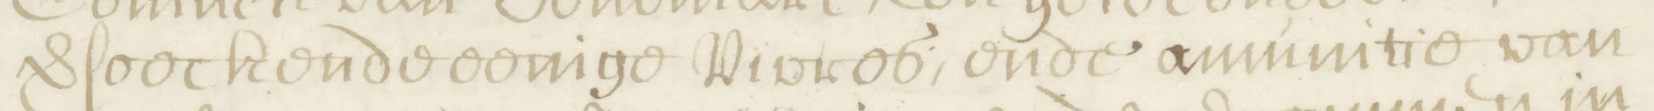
vsoeckende eenige Vivres, ende amutie van
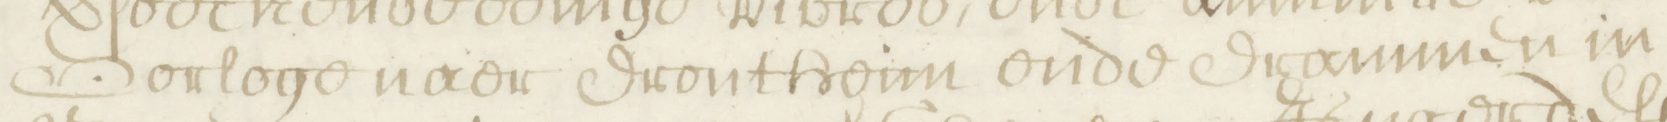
Oorloge naer Drontheim ende Drammen in
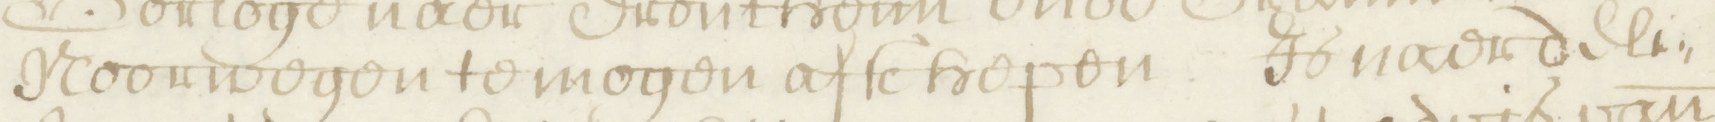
Noorwegen te mogen afschepen. Is naer deli„
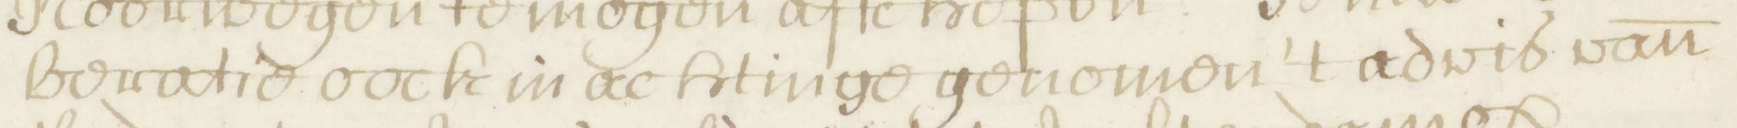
beratie oock in achtinge genomen 't advis van
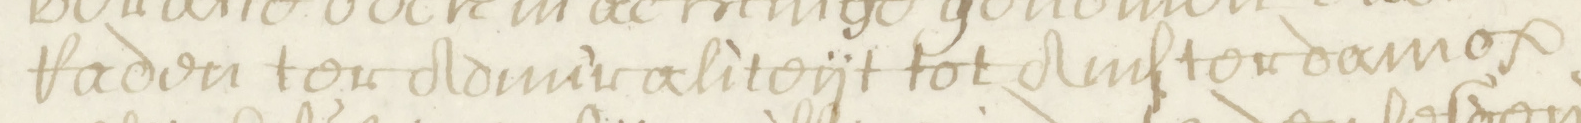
Raden ter Admiraliteijt tot Amsterdam op
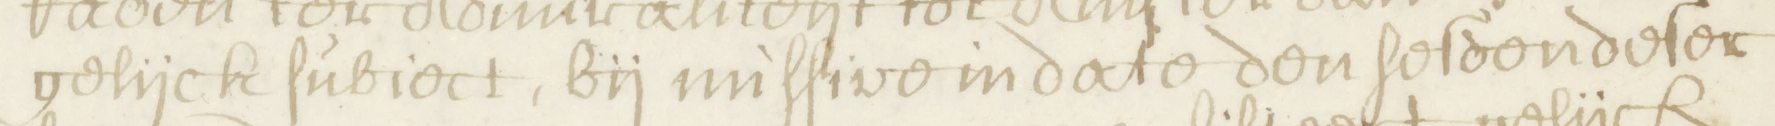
gelijck subiect, bij missive indate den sesden deser
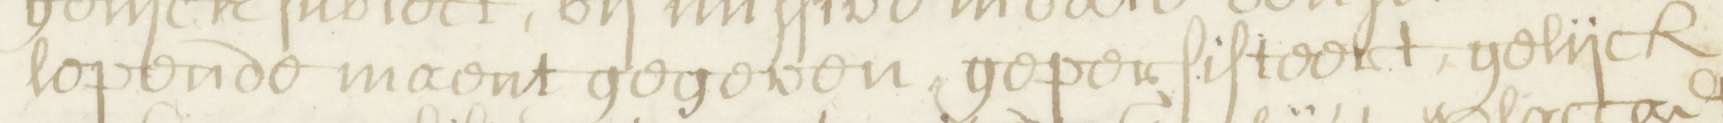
lopende maent gegeven, gepersisteert, gelijck
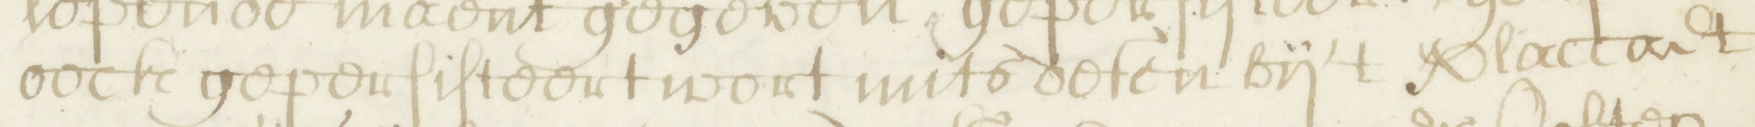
oock gepersisteert wort mits desen bij't Placcaet
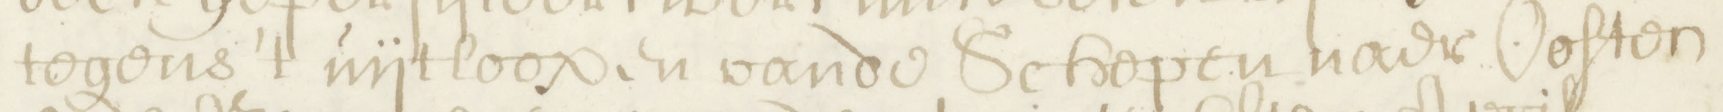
tegens 't uijtloopen vande Schepen naer Oosten
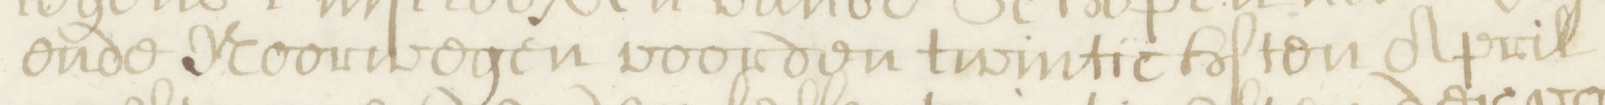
ende Noorwegen voorden twintichsten April
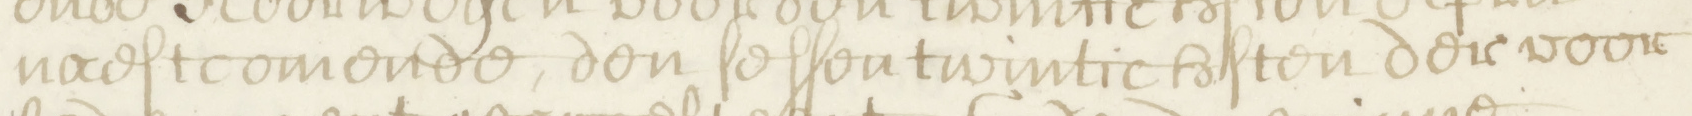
naestcomende, den sessentwintichsten der voor
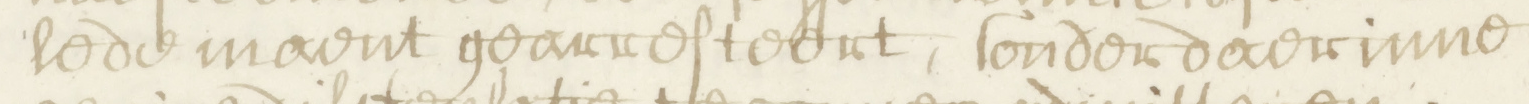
lede maent gearresteert, sonder daerinne
